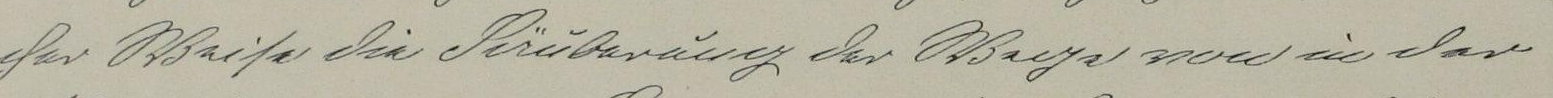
cher Weise die Säuberung der Wege von in der
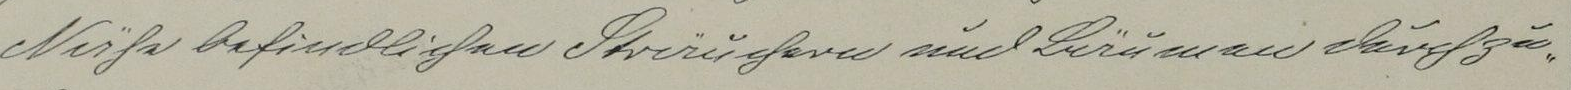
Nähe befindlichen Sträuchern und Bäumen durchzu-
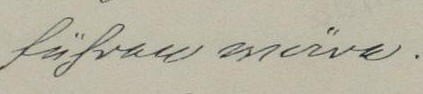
führen wäre.
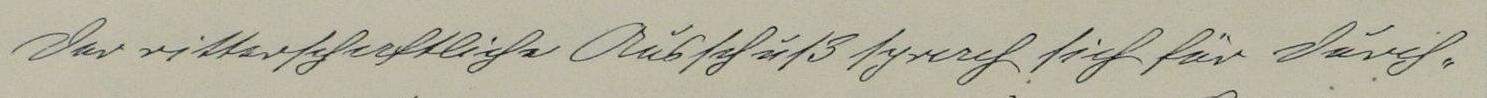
Der ritterschaftliche Ausschuß sprach sich für Durch-
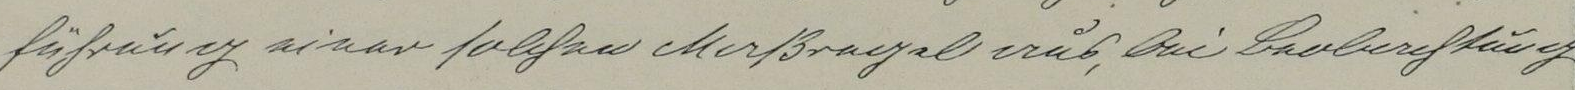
führung einer solchen Maßregel aus, bei Beobachtung
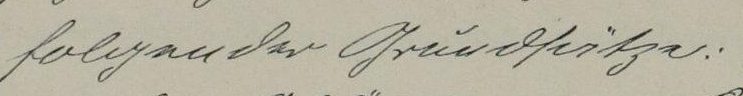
folgender Grundsätze:
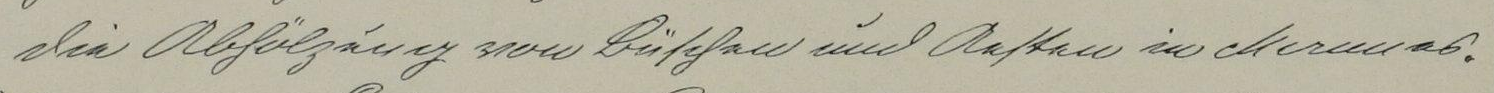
die Abhölzung von Büschen und Aesten in Mannes-
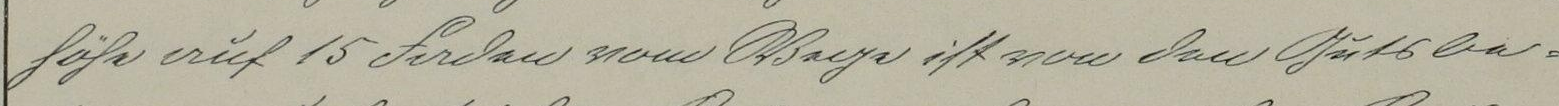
höhe auf 15 Faden vom Wege ist von den Gutsbe-
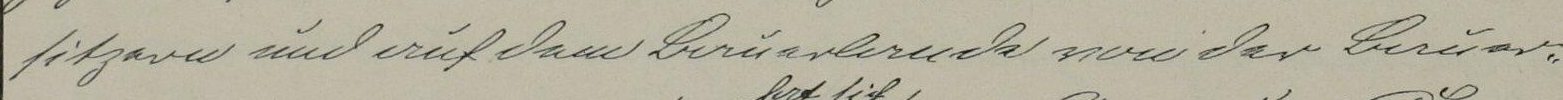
sitzern und auf dem Bauerlande von der Bauer-
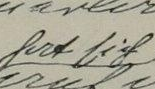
hat sich
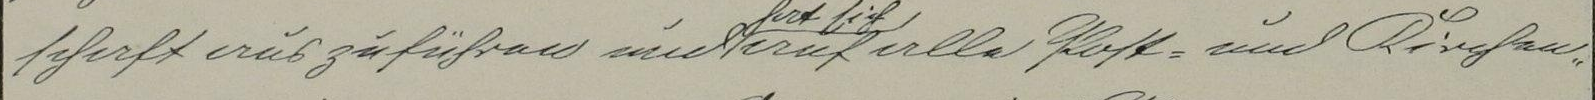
schaft auszuführen und auf alle Post- und Kirchen-
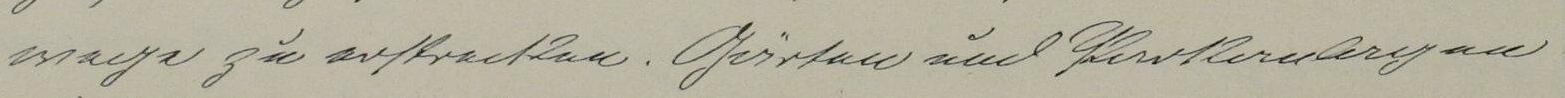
wege zu erstrecken. Gärten und Parkanlagen
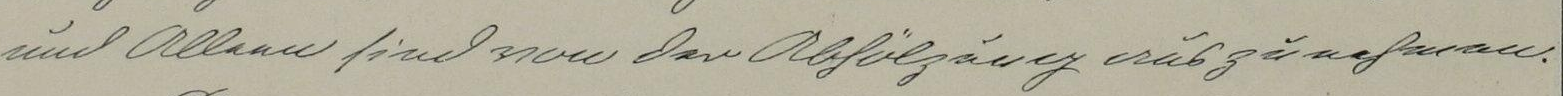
und Alleen sind von der Abhölzung auszunehmen.
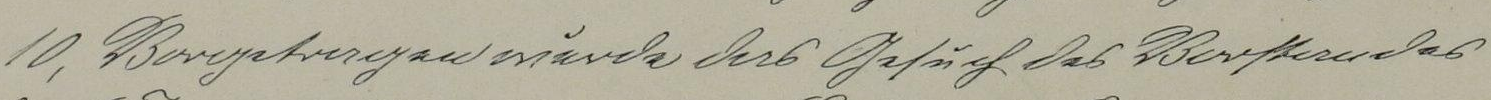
10. Vorgetragen wurde das Gesuch des Vorstandes
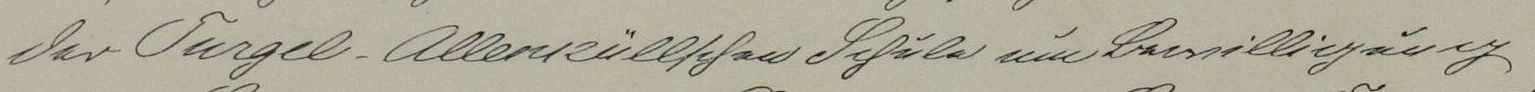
der Turgel-Allenküllschen Schule um Bewilligung
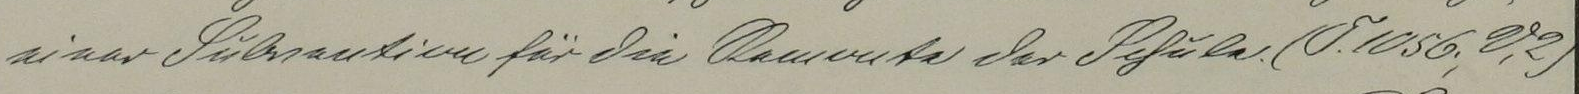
einer Subvention für die Remonte der Schule (T.1056; V.2).
